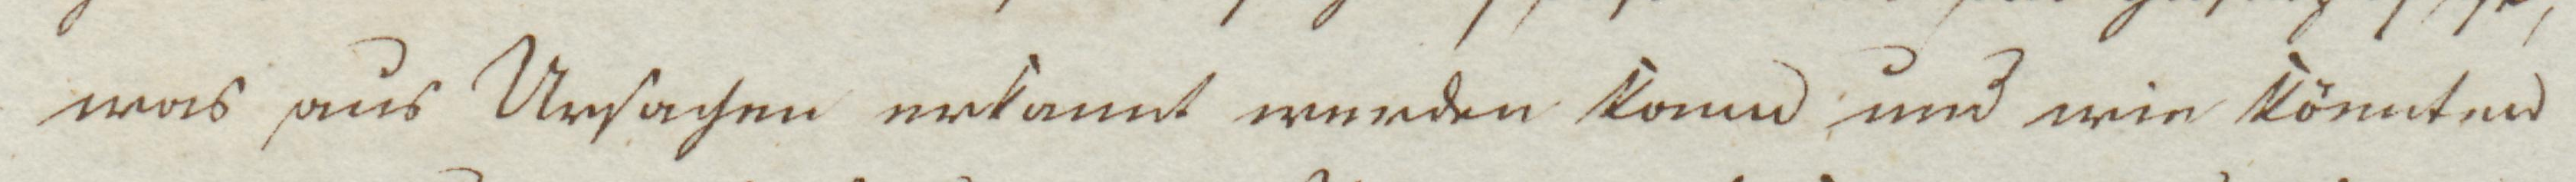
was aus Ursachen erkannt werden kann und wie könnten
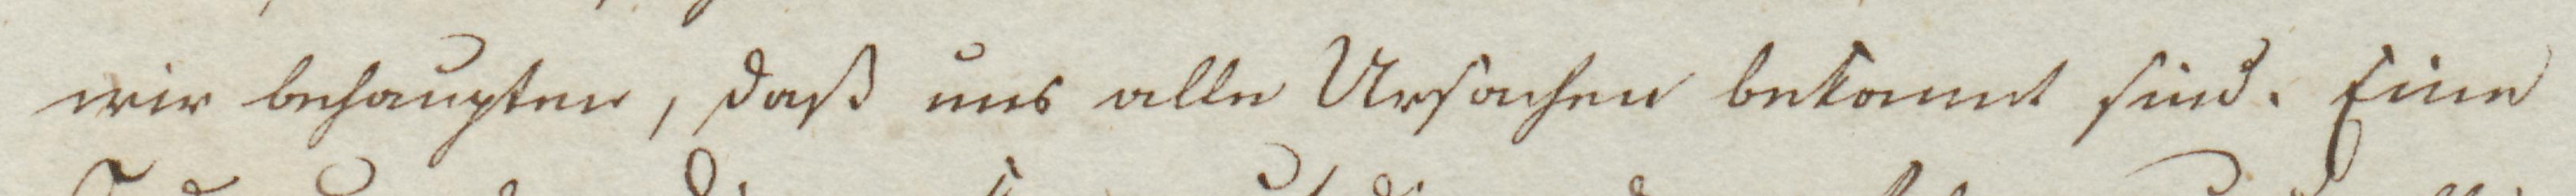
wir behaupten, daß uns alle Ursachen bekannt sind. Eine
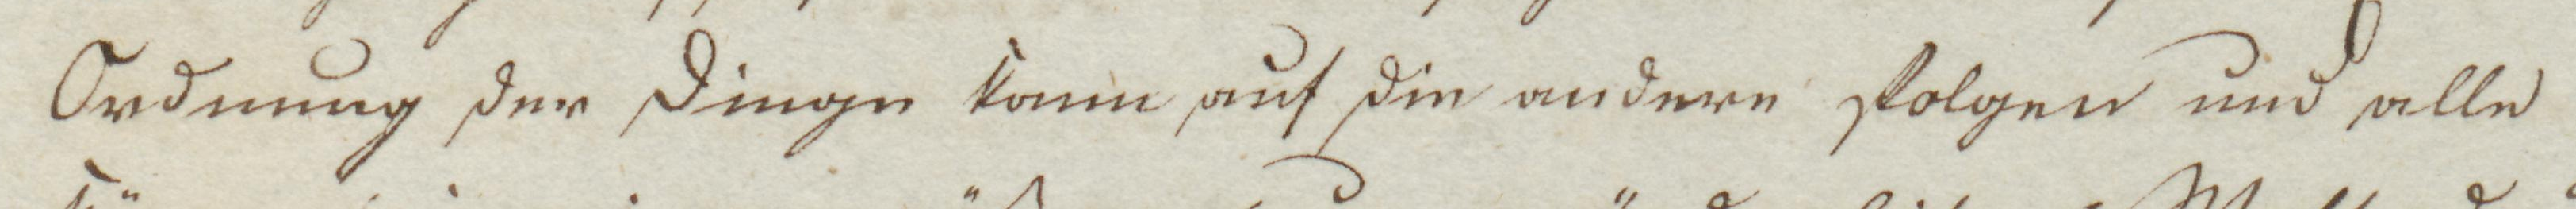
Ordnung der Dinge kann auf die andere folgen und alle
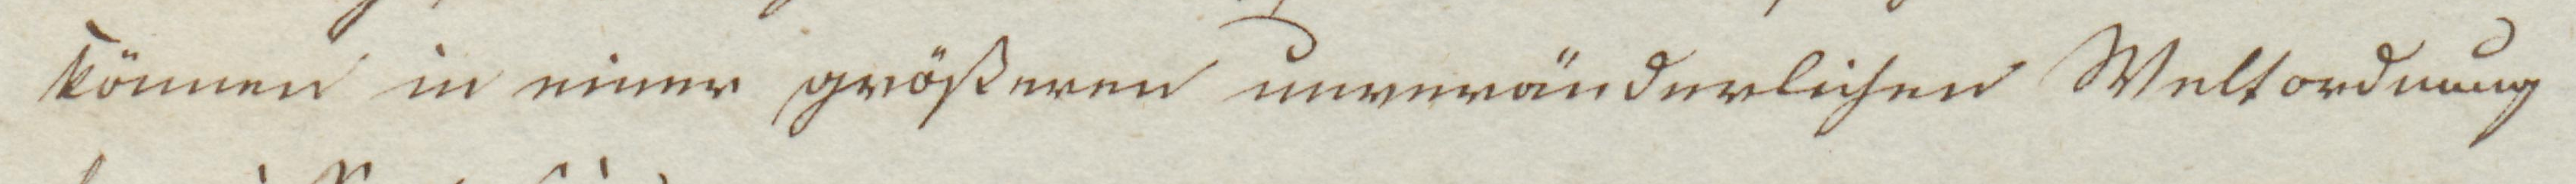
können in einer größeren unveränderlichen Weltordnung
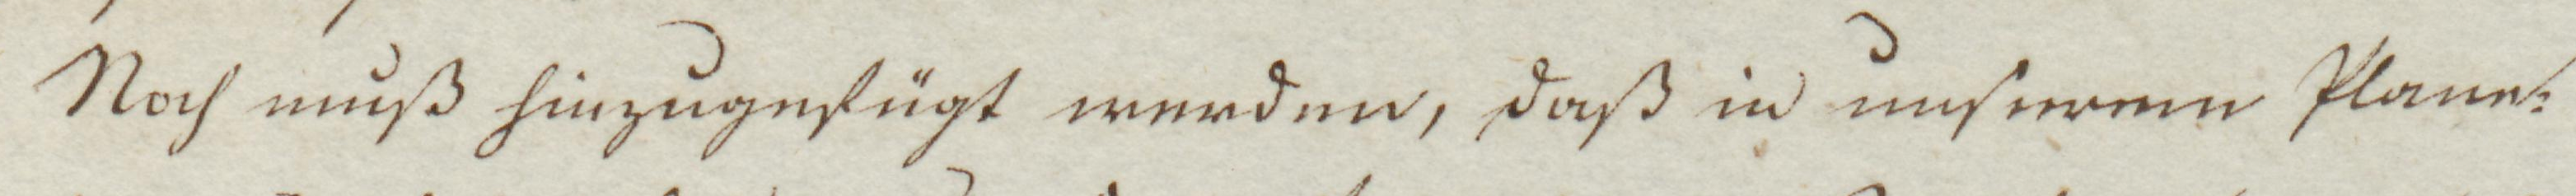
Noch muß hinzugefügt werden, daß in unserem Plane-
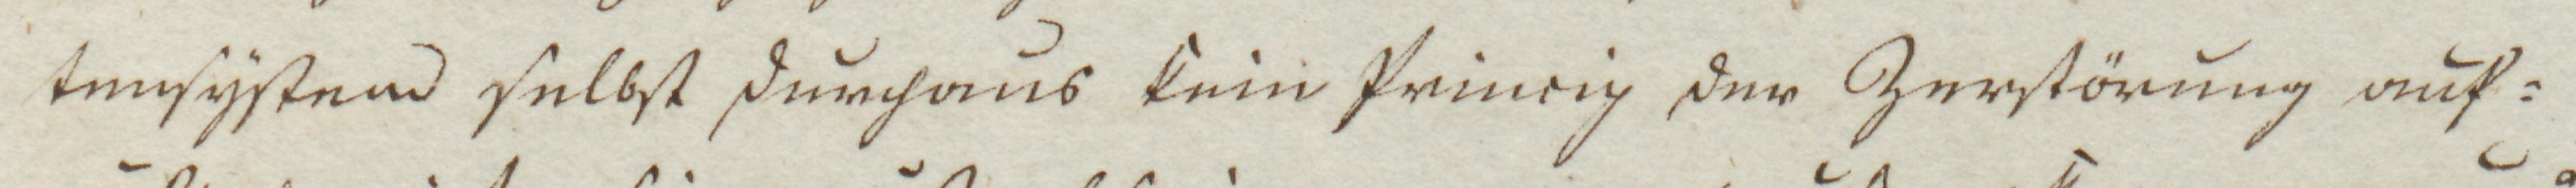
tensÿstem selbst durchaus kein Princip der Zerstörung auf-
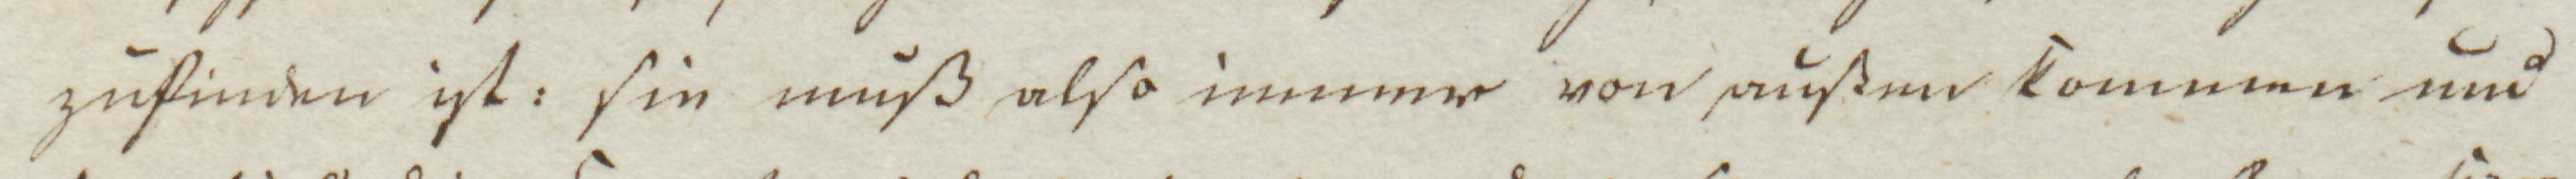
zufinden ist: sie muß also immer von außen kommen und
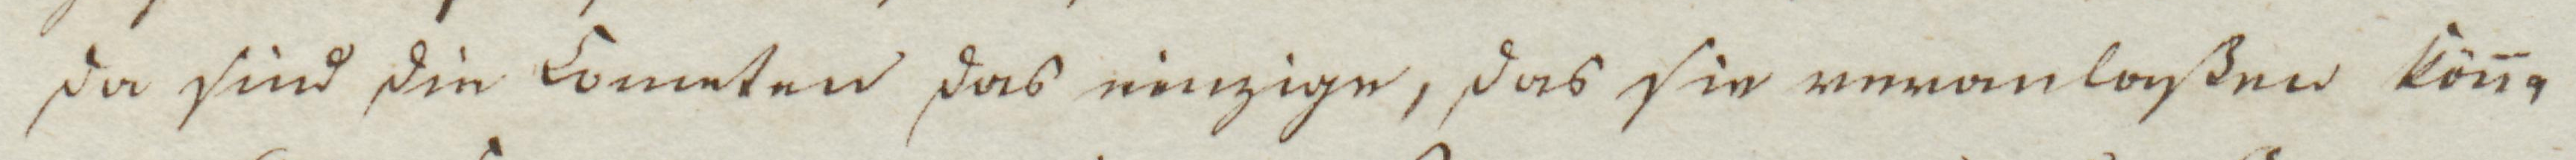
da sind die Cometen das einzige, das sie veranlaßen köñ-
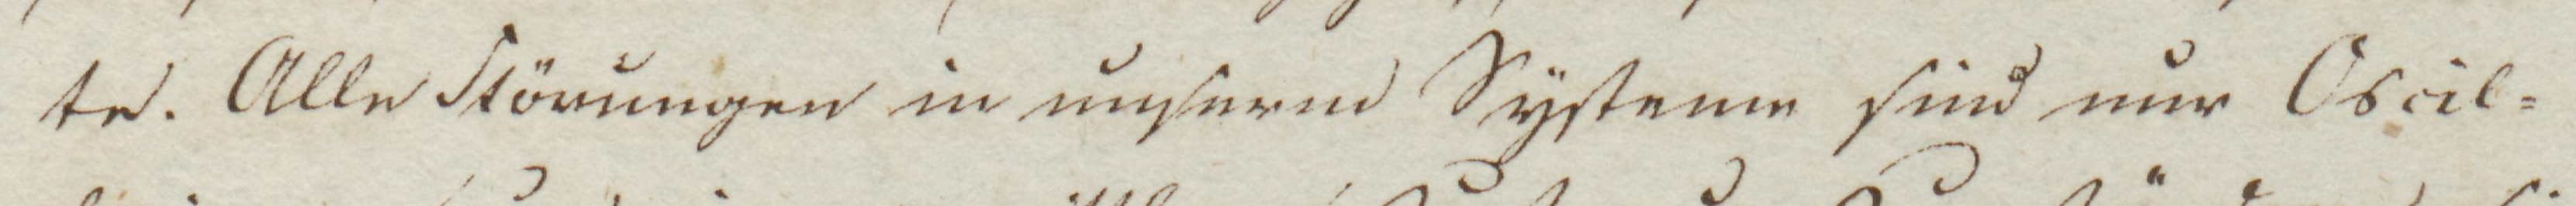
te. Alle Störungen in unserm Sÿsteme sind nur Oscil-
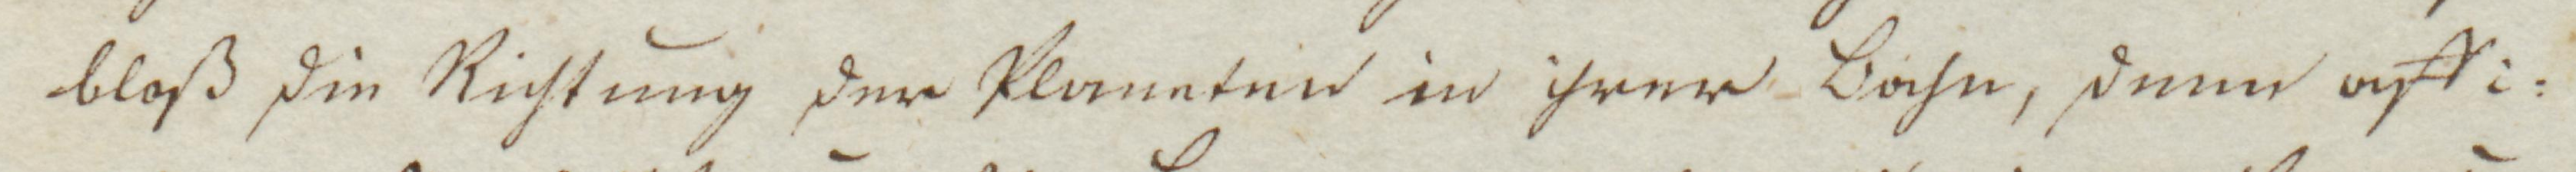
bloß die Richtung der Planeten in ihrer Bahn, denn affi-
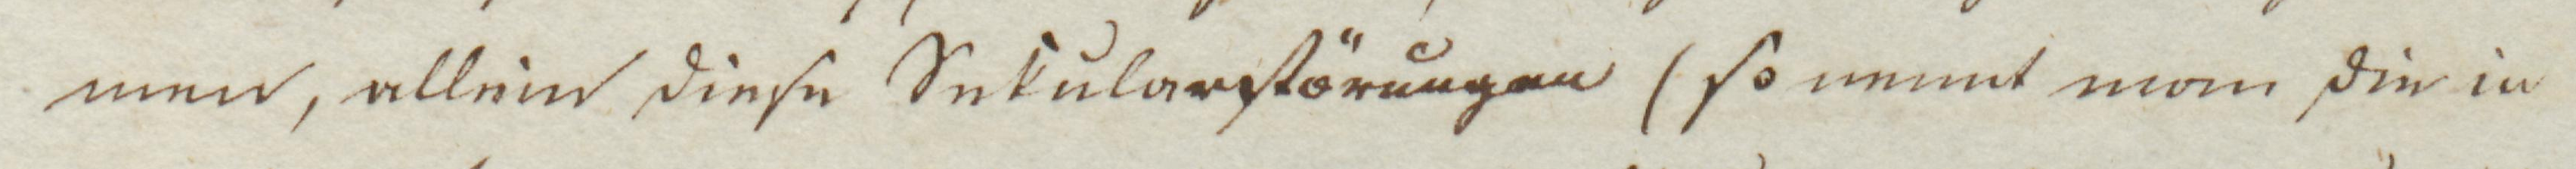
men, allein diese Sekularstörungen sind meist ab- und
